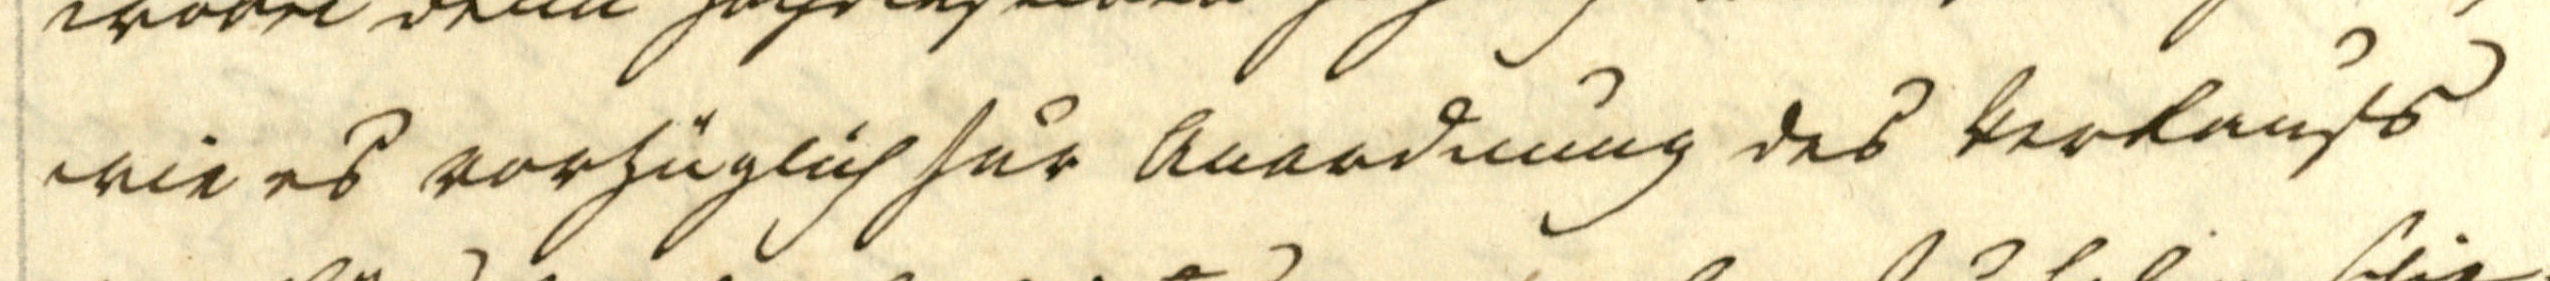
wie es vorzüglich zur Anordnung des Verkaufs
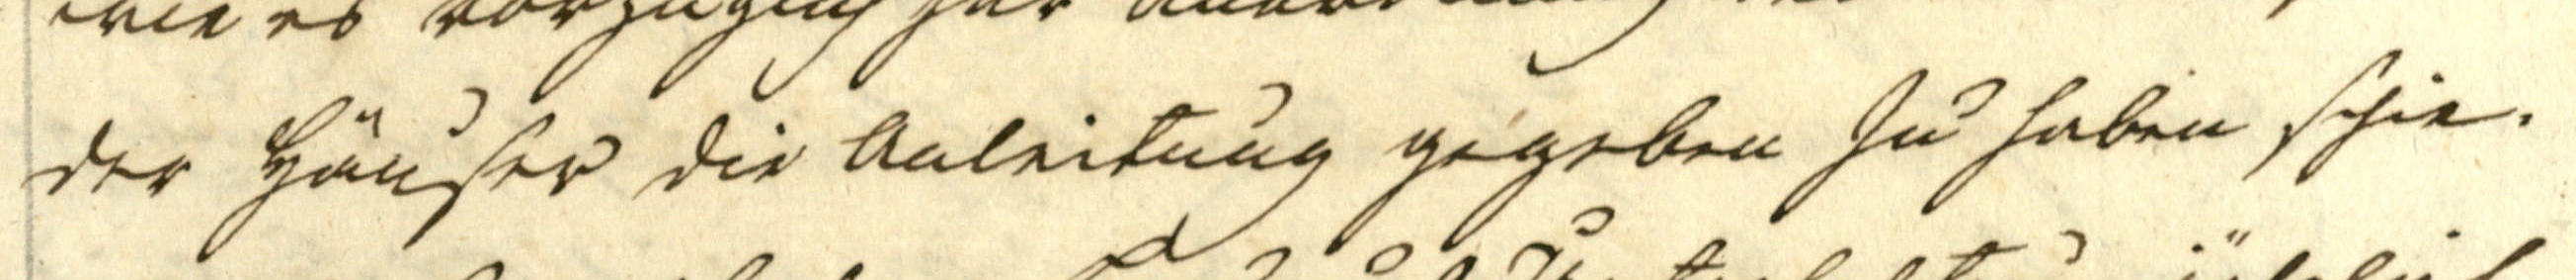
der Häuser die Anleitung gegeben zu haben schie¬
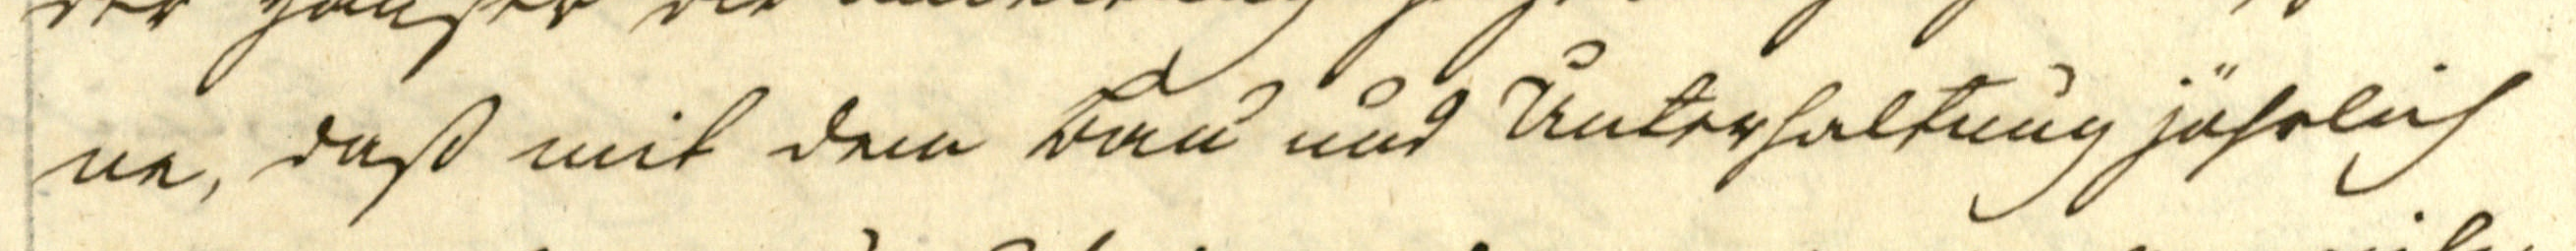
ne, daß mit dem Bau und Unterhaltung jährlich
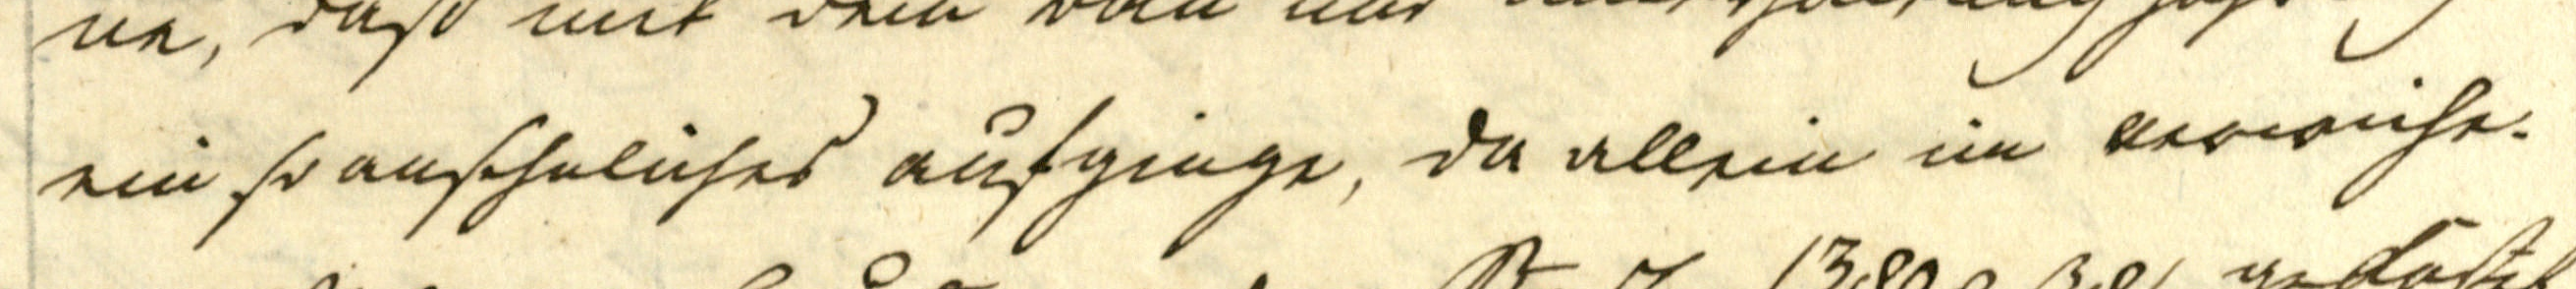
ein so ansehnliches aufginge, da allein im verwiche¬
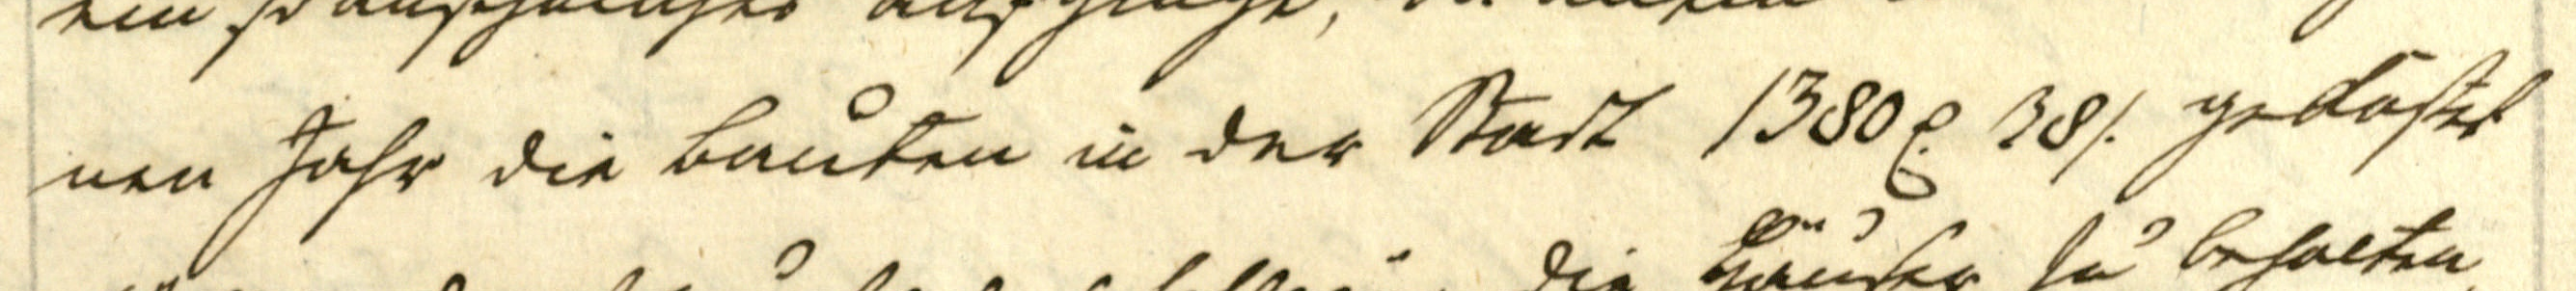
nen Jahr die Bauten in der Stadt 1380 l. 38 s. gekostet
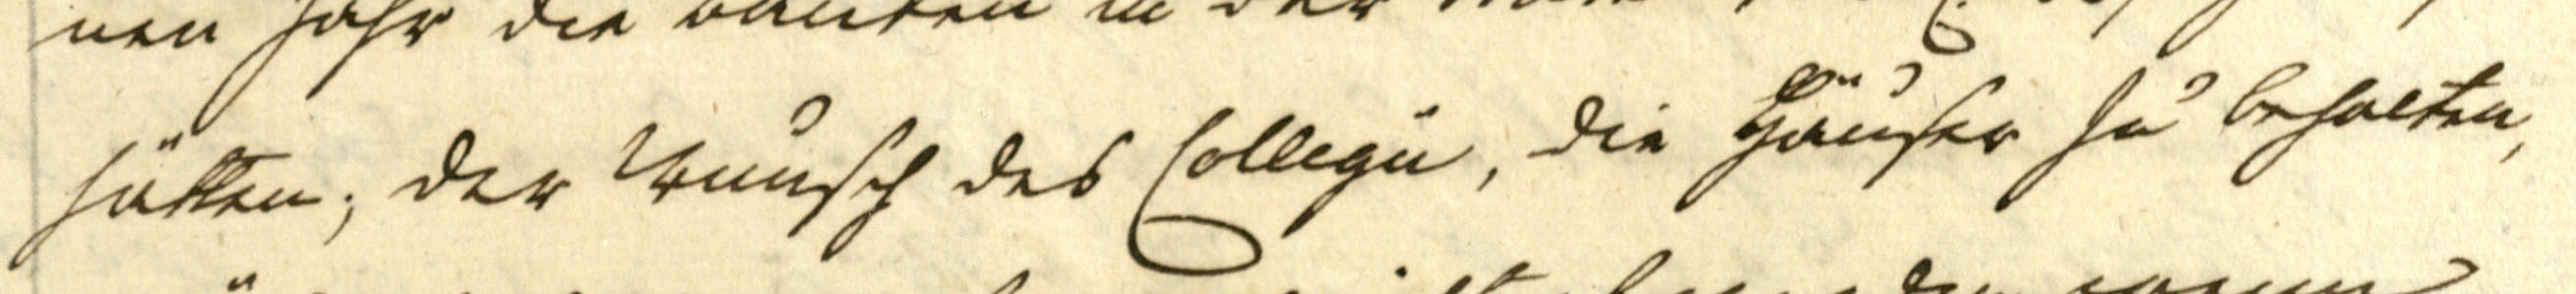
hätten, der Wunsch des Collegii, die Häuser zu behalten,
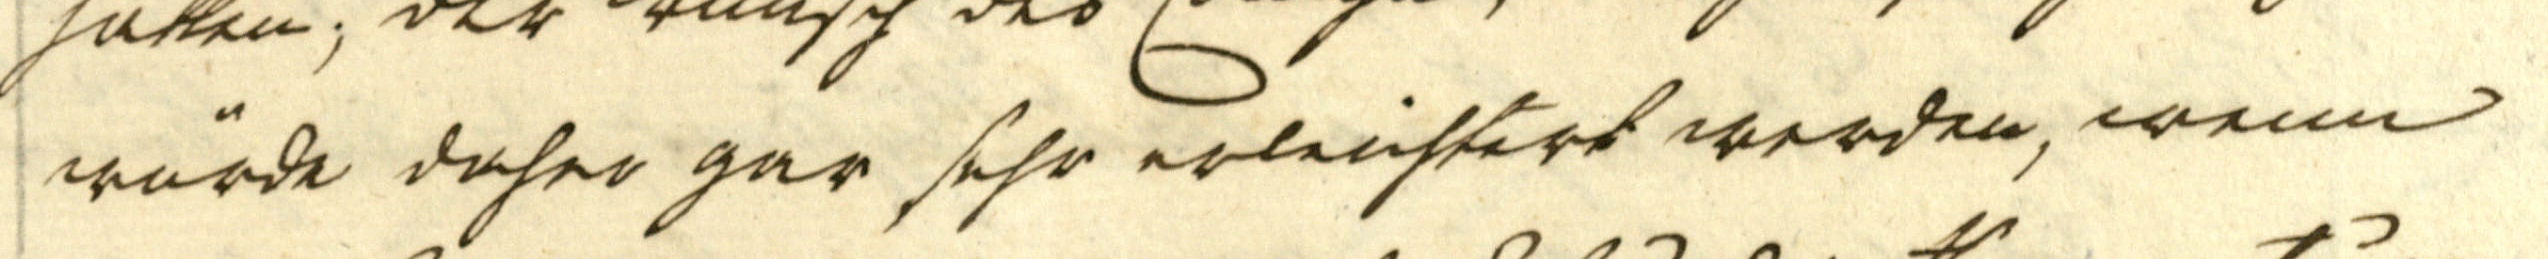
würde daher gar sehr erleichtert werden, wenn
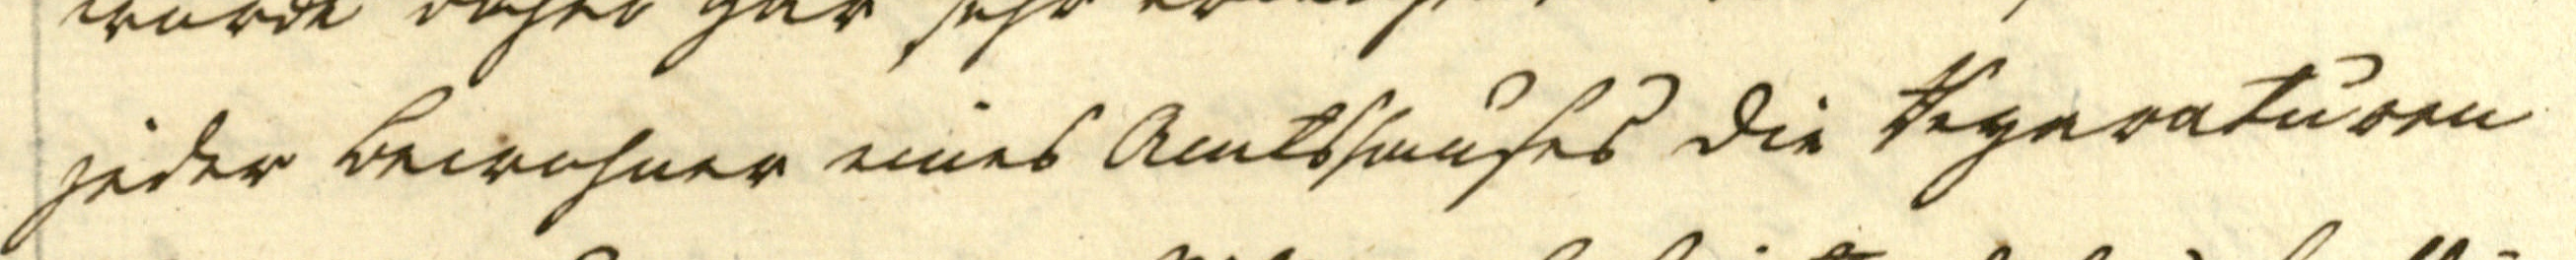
jeder Bewohner eines Amtshauses die Reparaturen
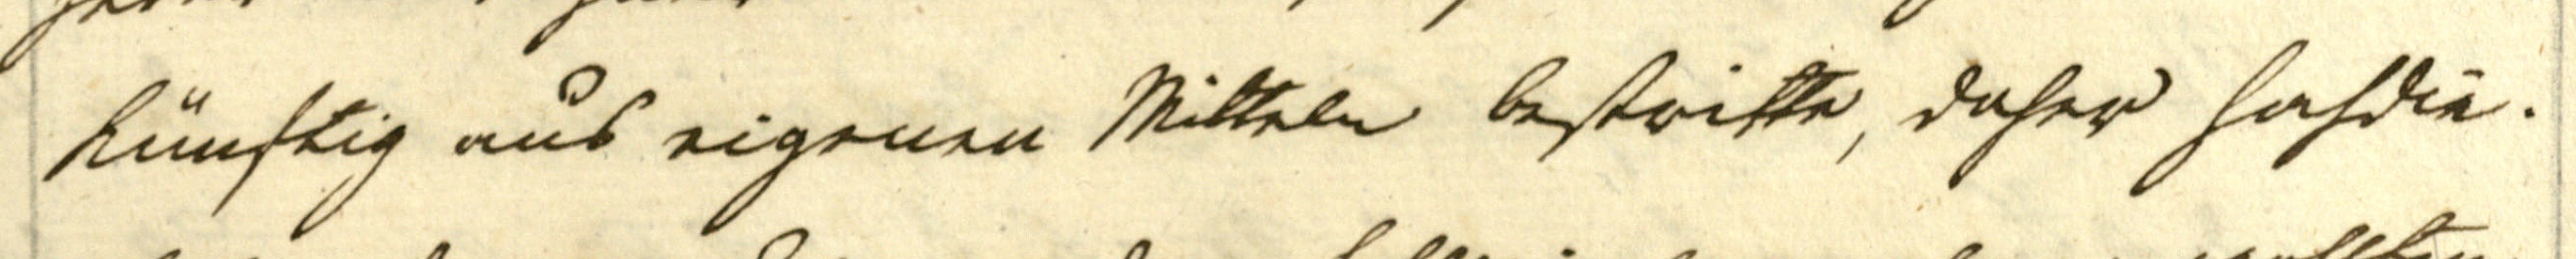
künftig aus eigenen Mitten bestritte, daher Hochdie¬
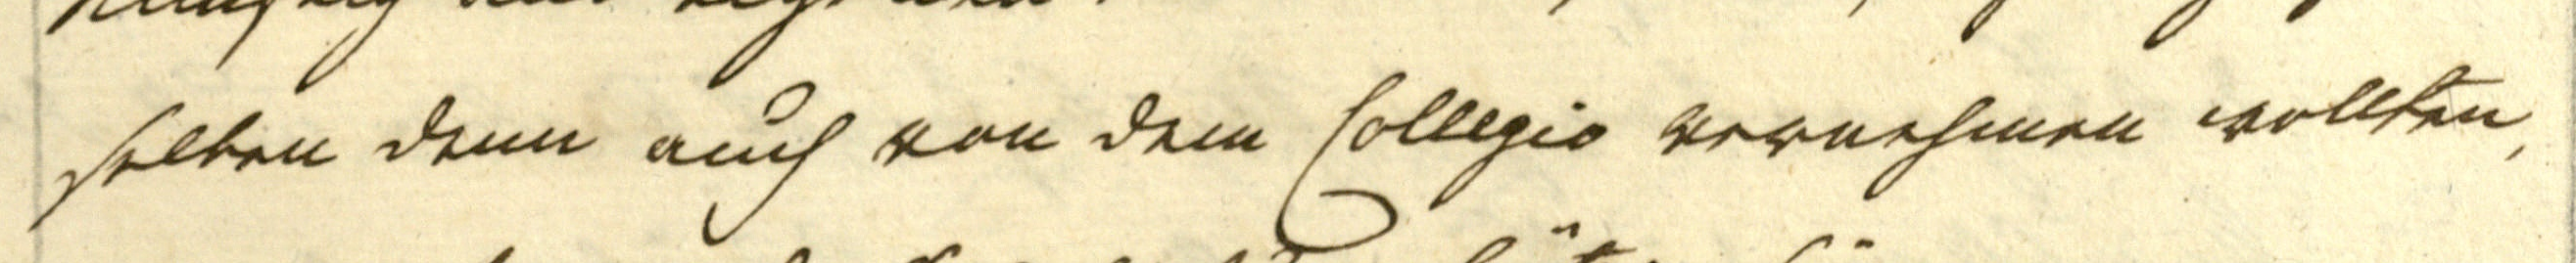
selben denn auch von dem Collegio vernehmen wollten,
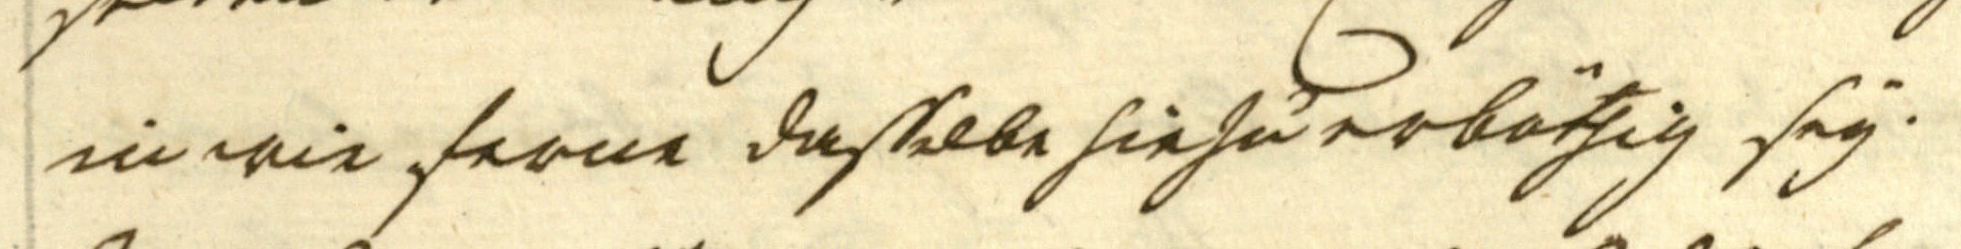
in wie ferne dasselbe hiezu erböthig seÿ.
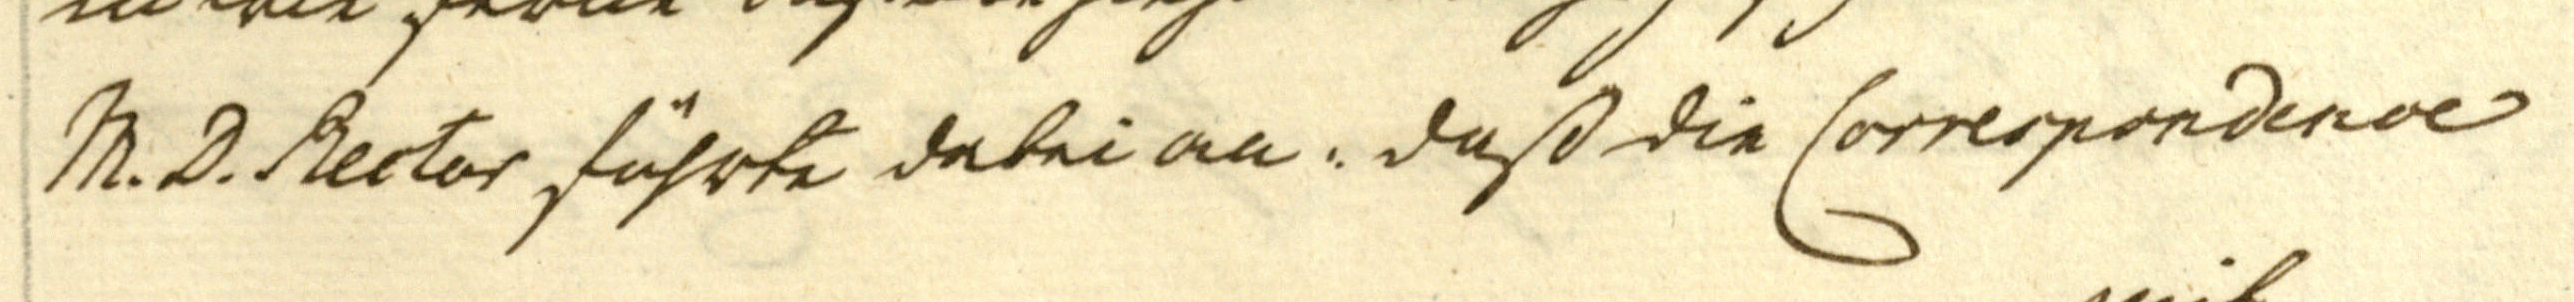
M. D. Rector führte dabei an: daß die Correspondence
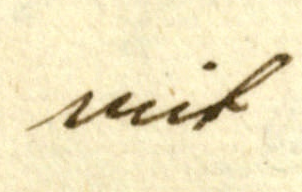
mit
